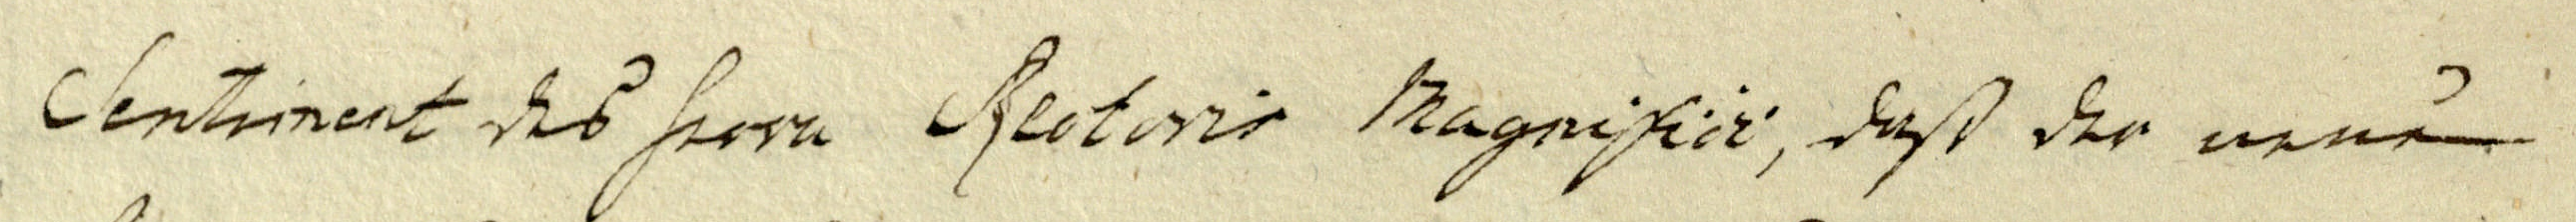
Sentiment des herrn Rectoris Magnifici, daß der neue
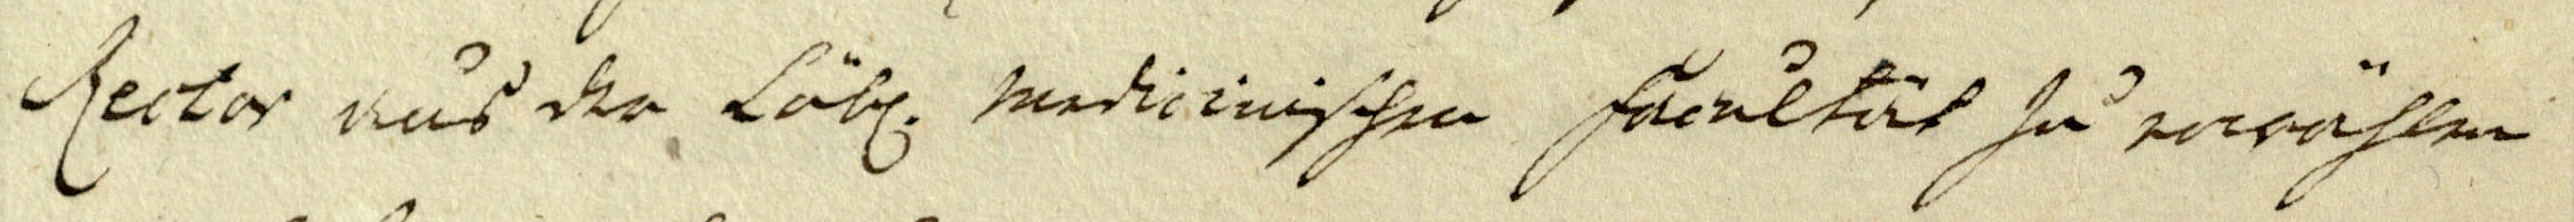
Rector aus der löbl. Medicinischen Facultät zu erwählen
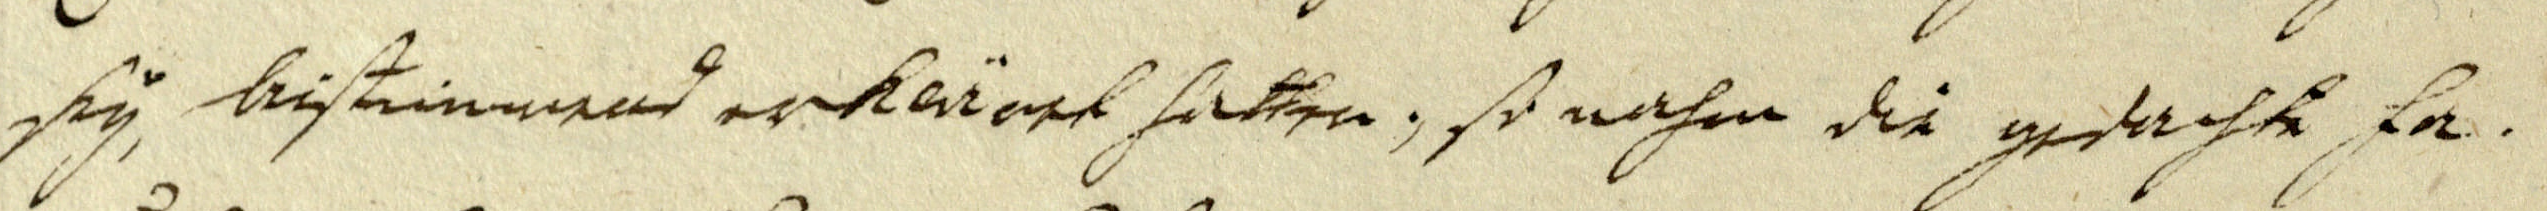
seÿ, beistimmend erkläret hatten, so nahm die gedachte Fa¬
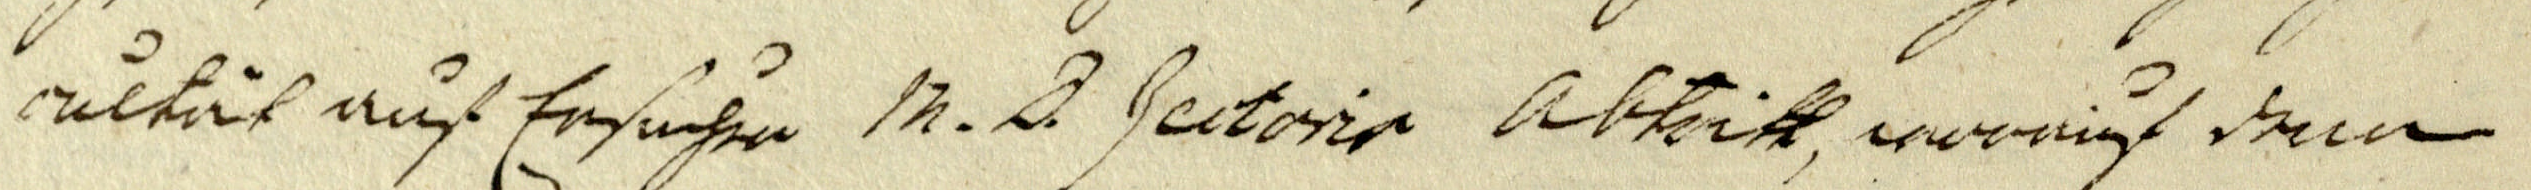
cultät auf Ersuchen M. D. Rectoris Abtritt, worauf denn
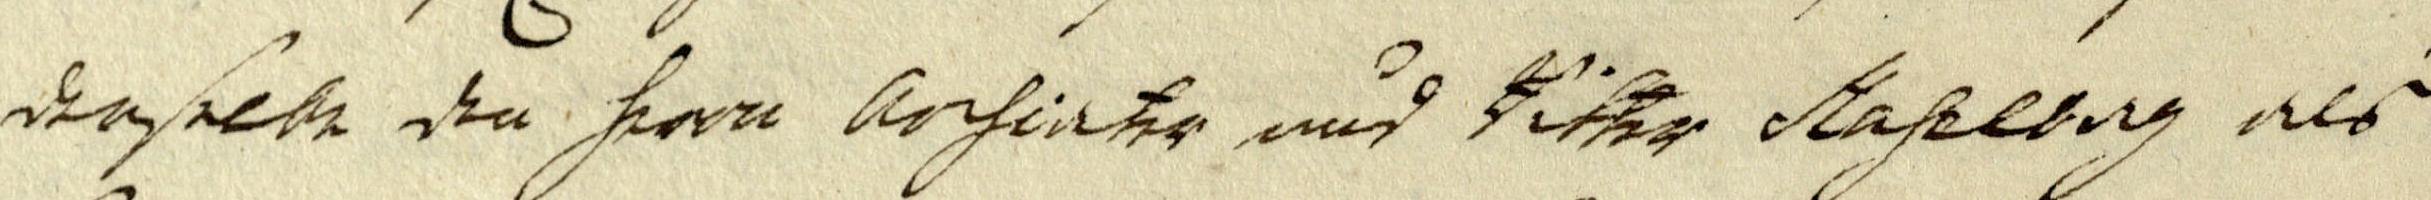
derselbe den herrn Archiater und Ritter Haselberg als
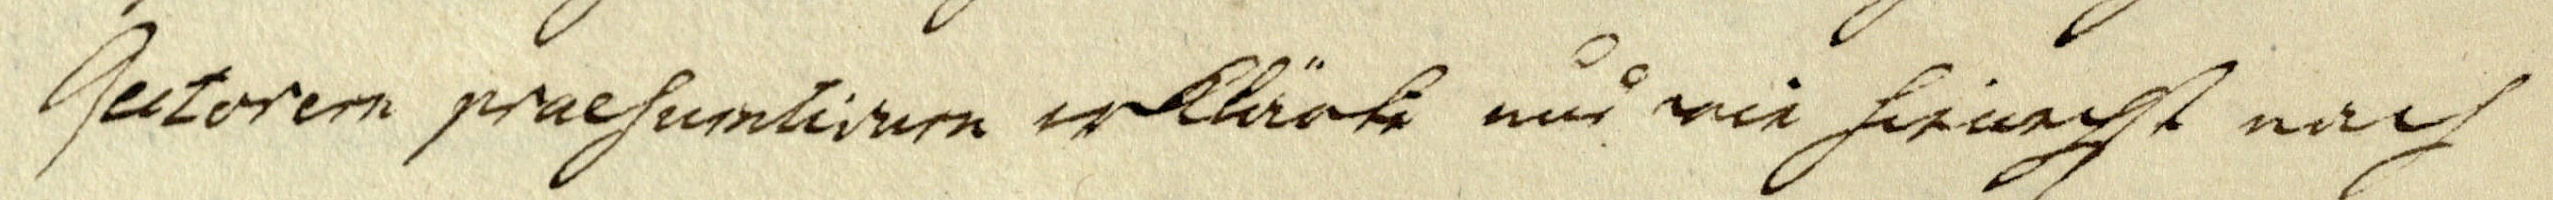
Rectorem praesumtivum erklärte und wie hienechst nach
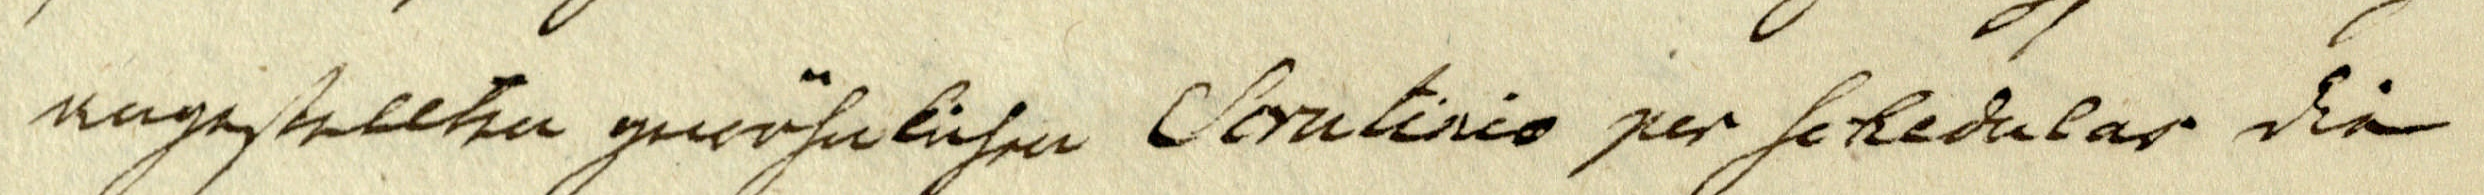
angestellten gewöhnlichen Scrutinis per schedulas die
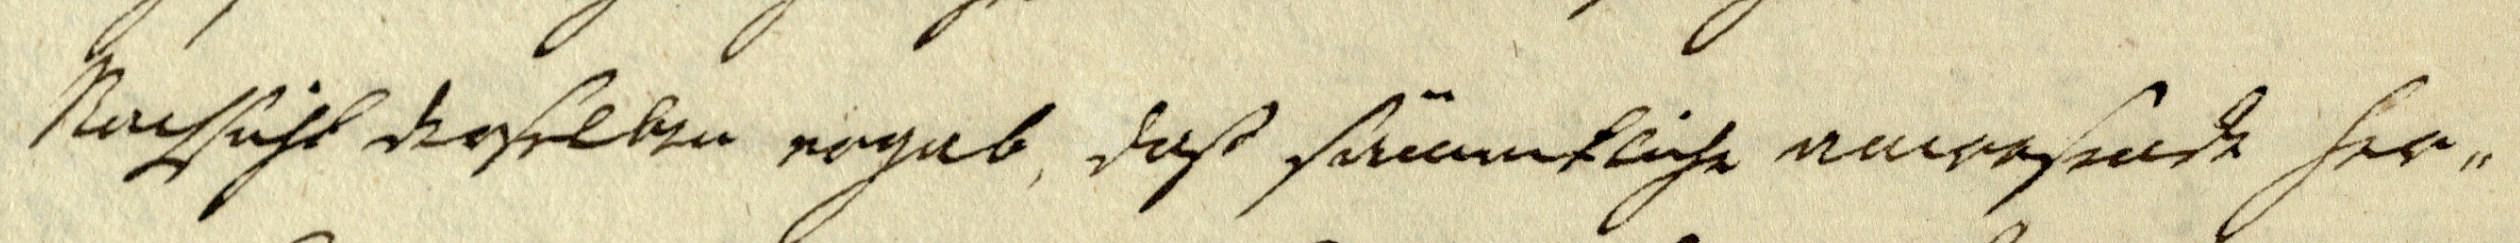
Nachsicht derselben ergab, daß sämmtliche anwesende her¬
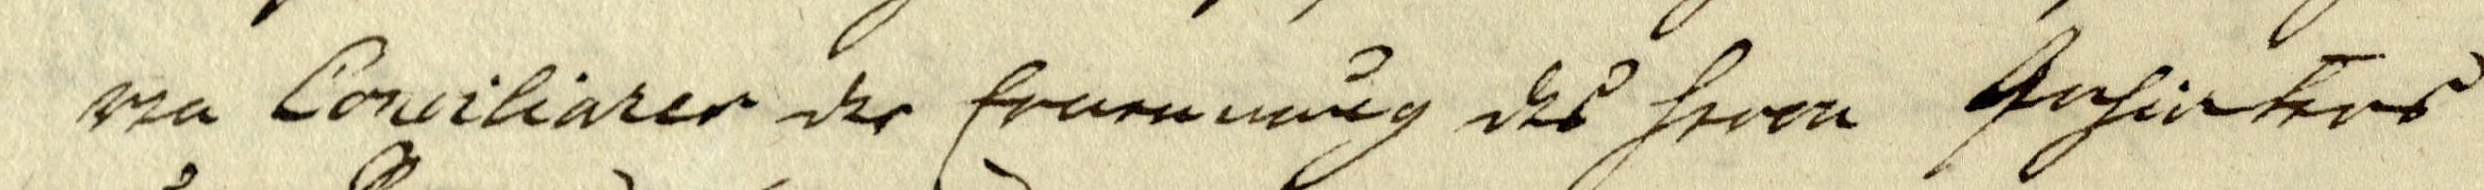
ren Conciliares der Ernennung des herrn Archiaters
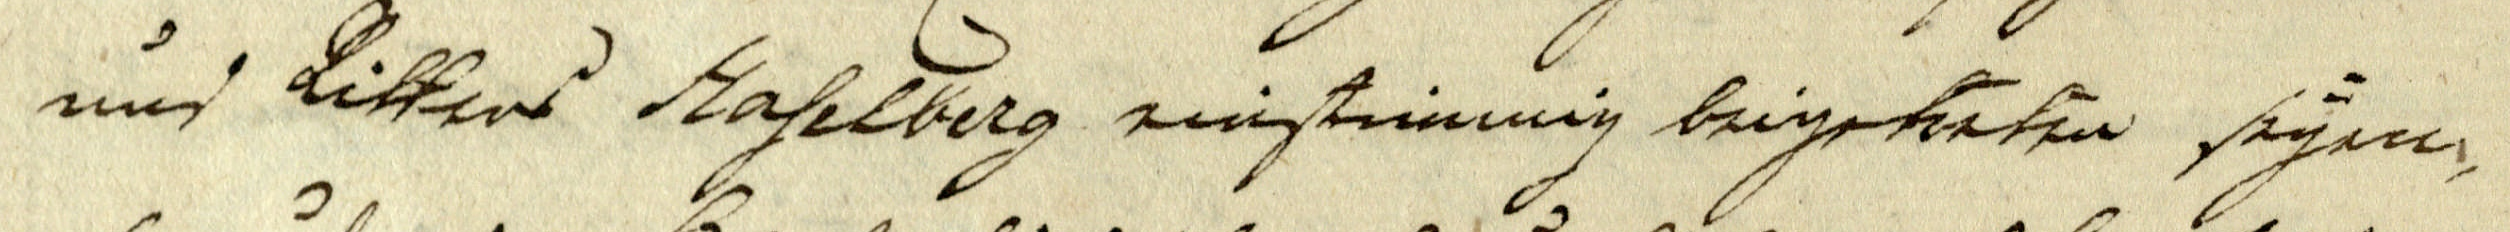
und Ritters Haselberg einstimmig beigetreten seÿen,
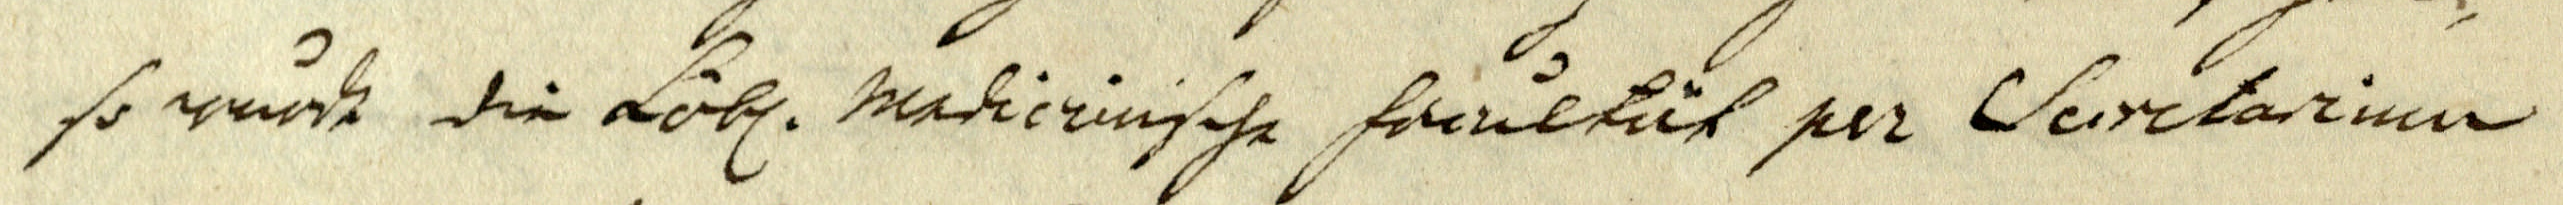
so wurde die löbl. Medicinische Facultät per Secretarium
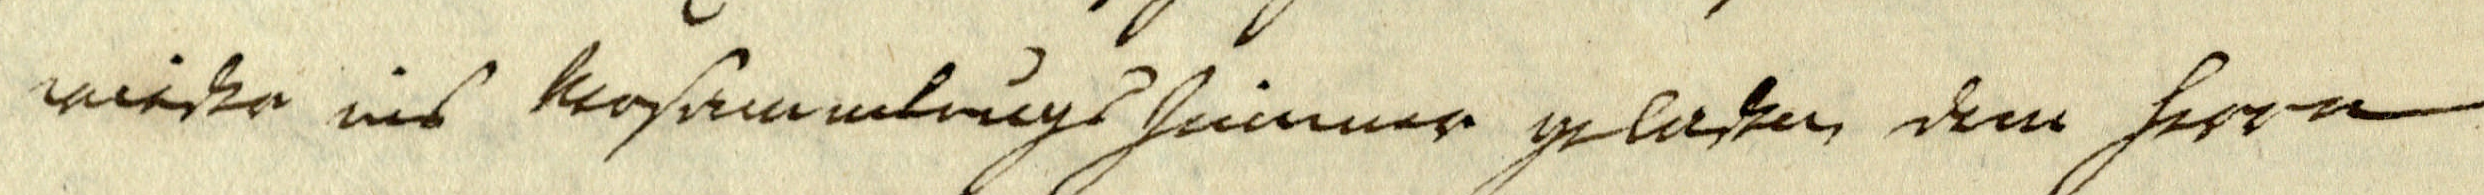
wieder ins Versammlungszimmer geladen, dem herrn
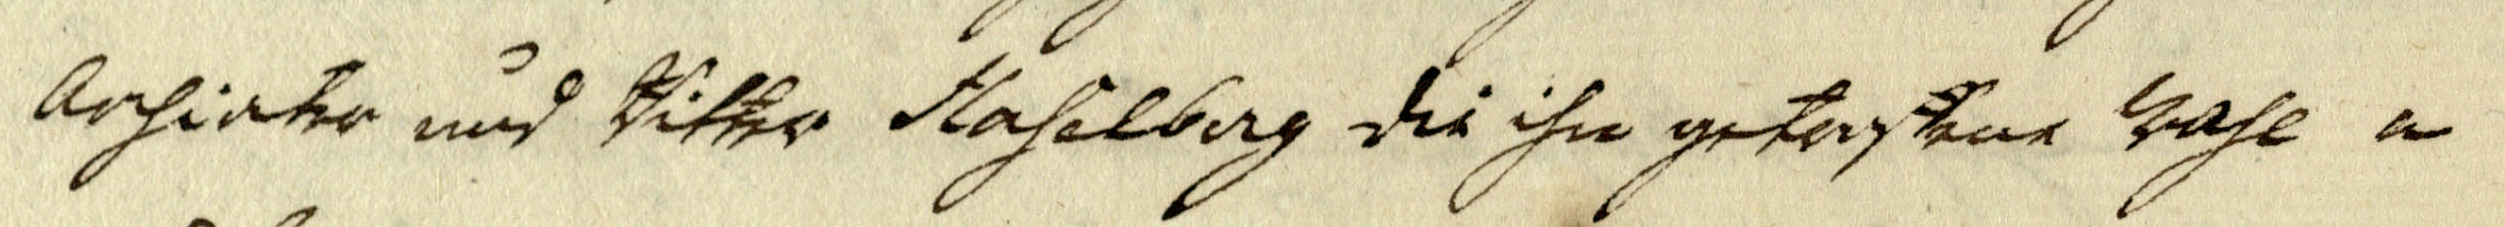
Archiater und Ritter Haselberg die ihn getroffene Wahl a
